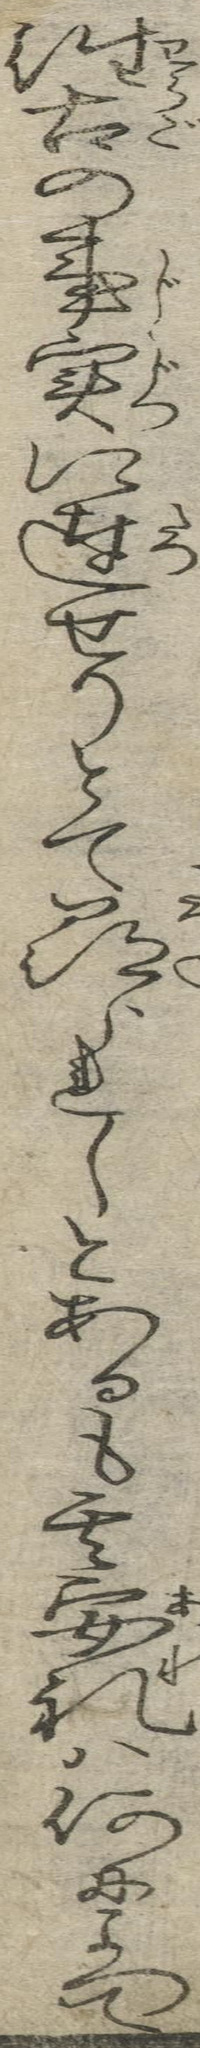往古の事実に達せりとて尋られしとあるも其安礼は何によつて

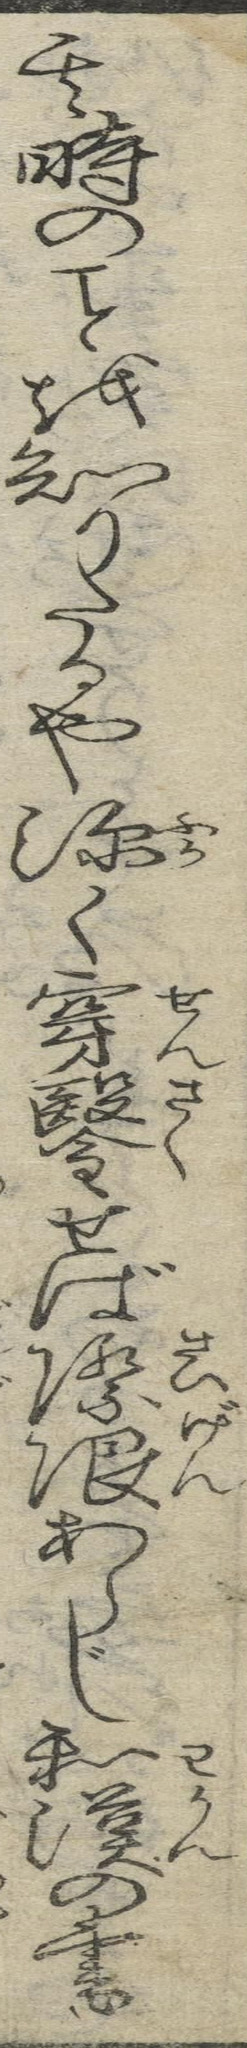其時のことを知りたるや深く穿鑿せば際限あらじ和漢の書
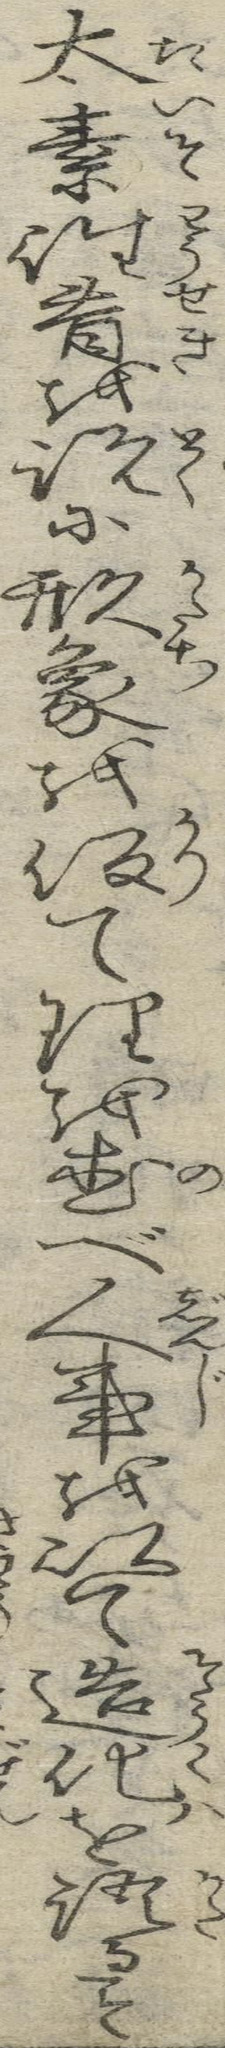太素往昔を説に形象を仮て理を述べ人事を以て造化を語ること
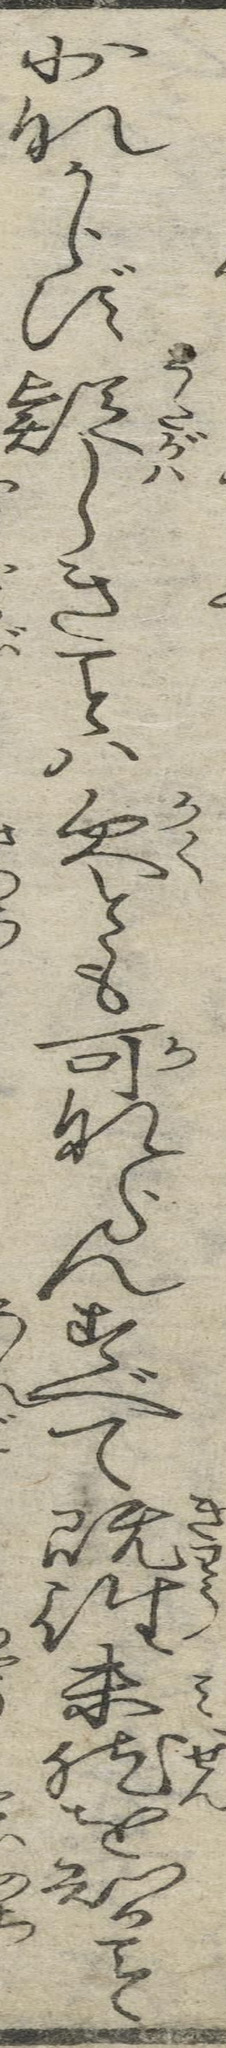少なからず疑しきことは欠とも可ならんすべて既往未然を知ること
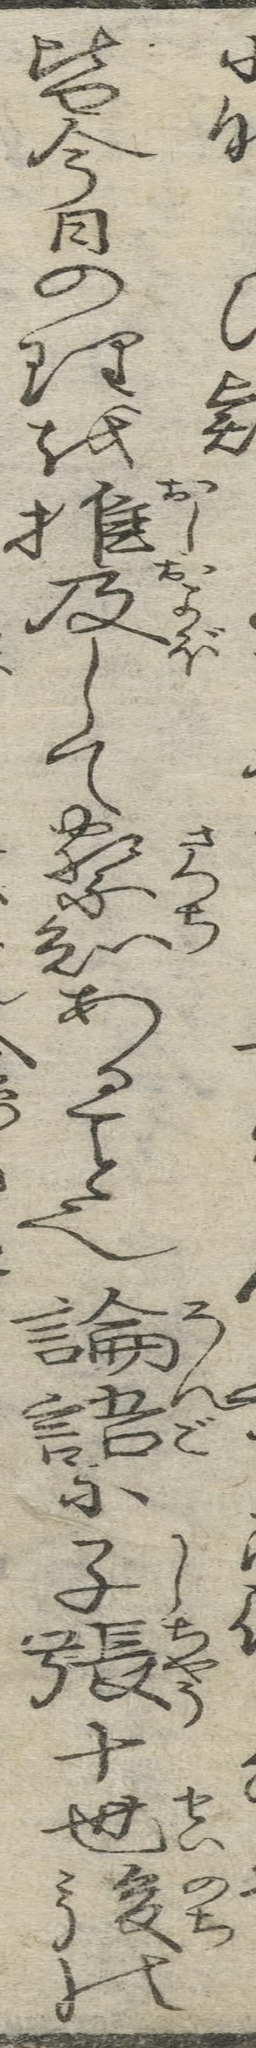皆今日の理を推及して察知あること也論語に子張十世後の
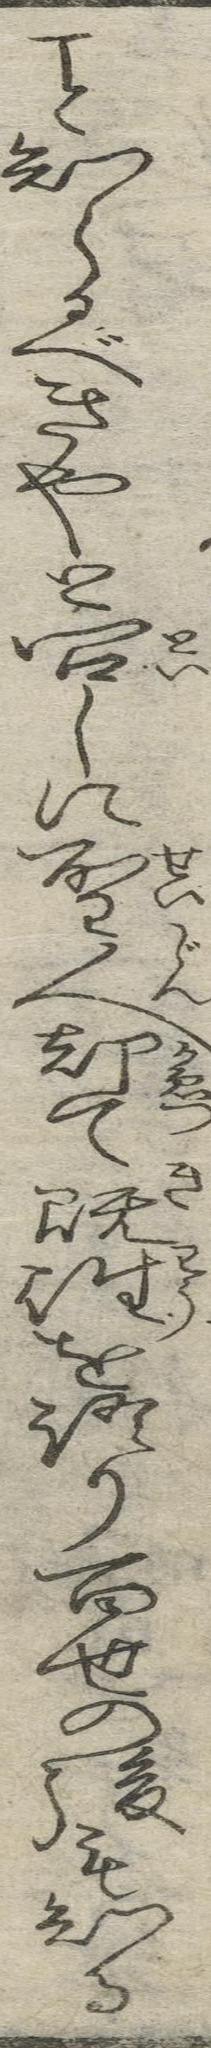こと知らるべきやと問しに聖人却て既往を語り百世の後も知る
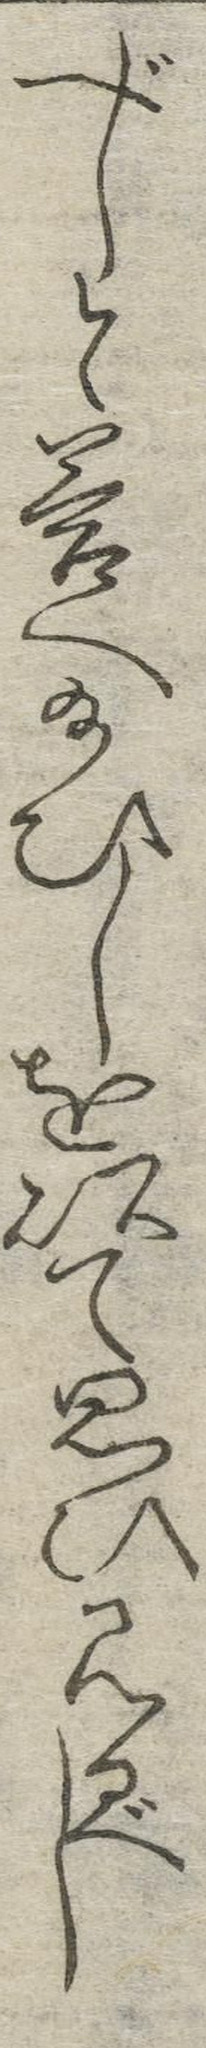べしと答え給ひしを以て思ひ見るべし
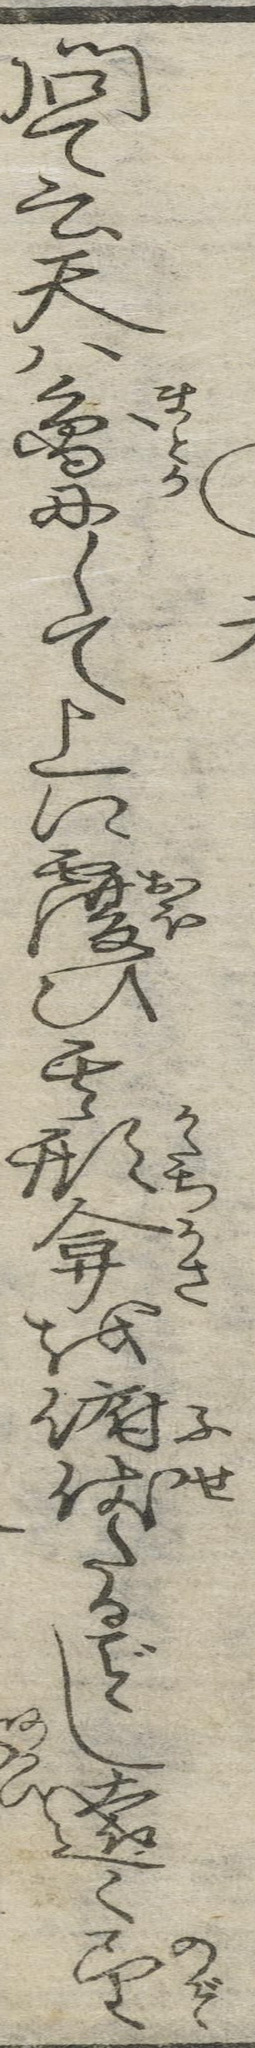問て云天は円にして上に覆ひ其形弇を俯伏たるごとし遠く望
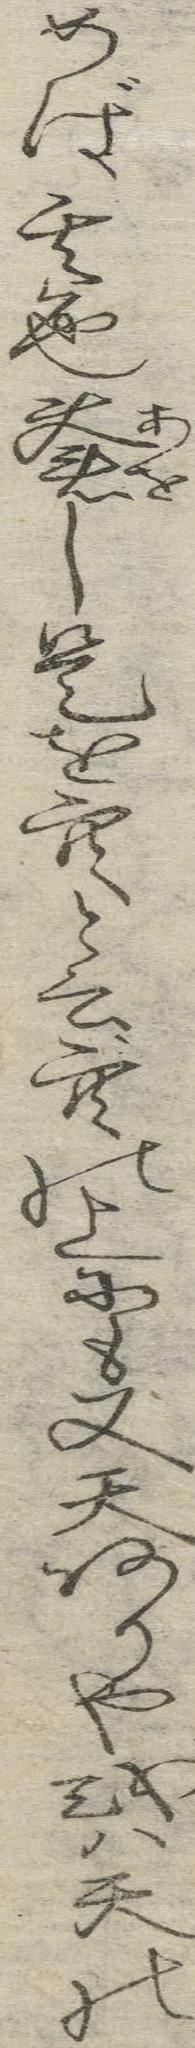めば其色蒼し是を空と云空の上にも又天ありや或は天の
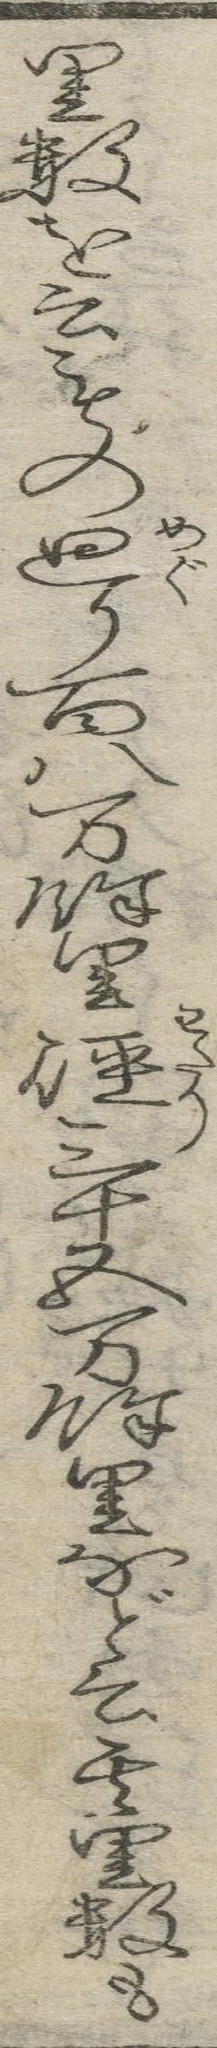里数を云もの廻り百八万余里経三十五万余里など云其里数も
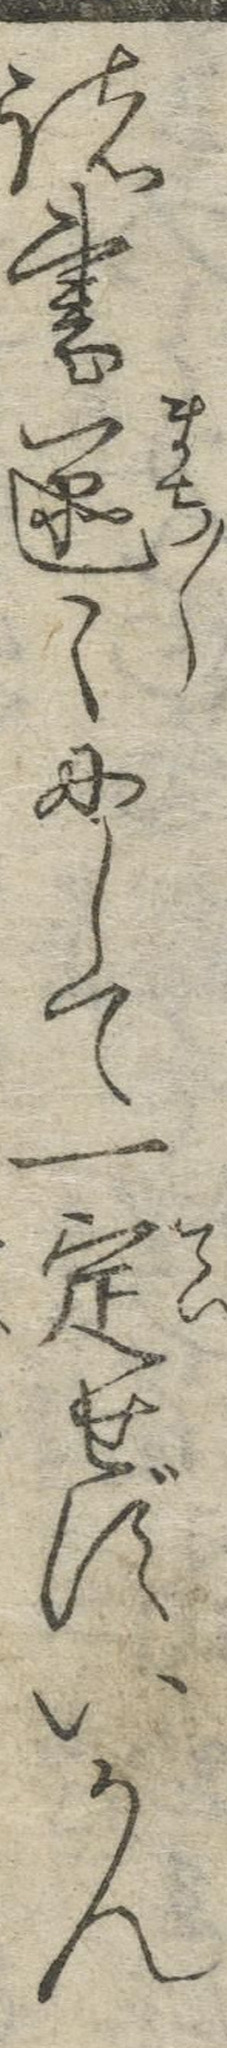諸書区々にして一定せずいかん
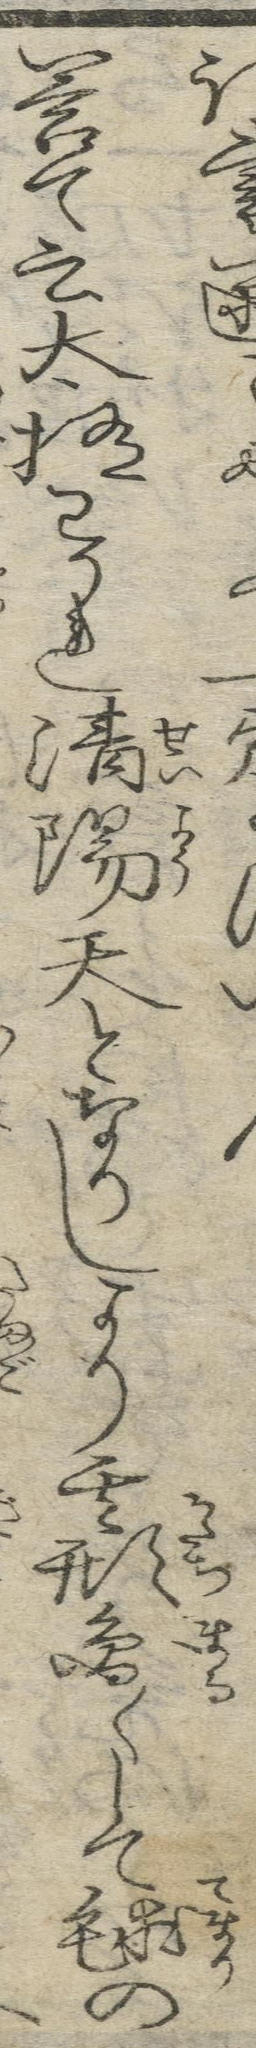答て云太極わかれ清陽天となりしより其形円くして毬の
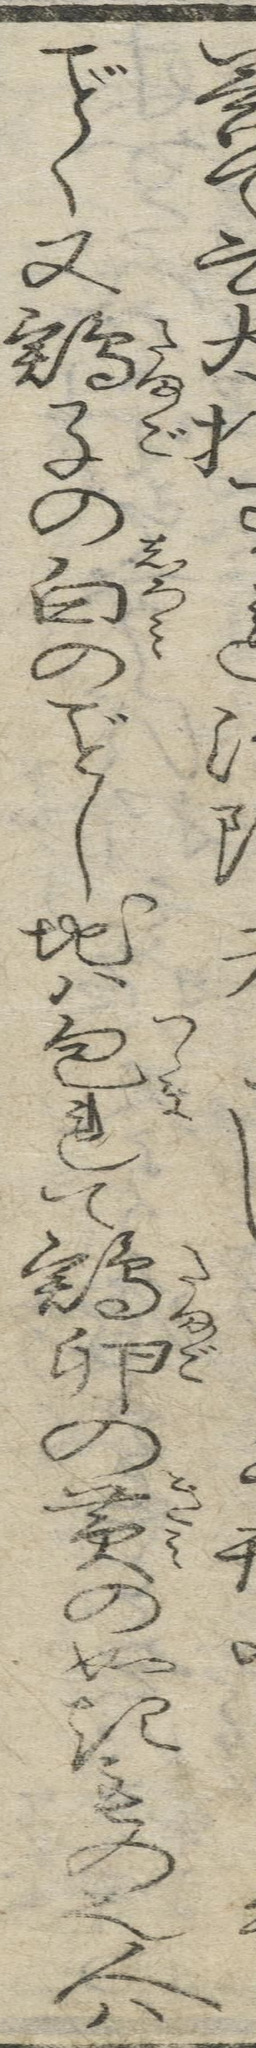ごとく又鶏子の白のごとし地は包れて鶏卵の黄の如きもの也人は
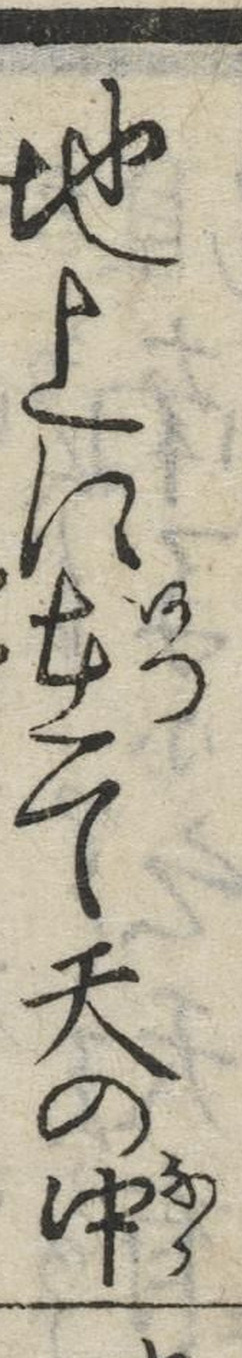地上に在て天の中
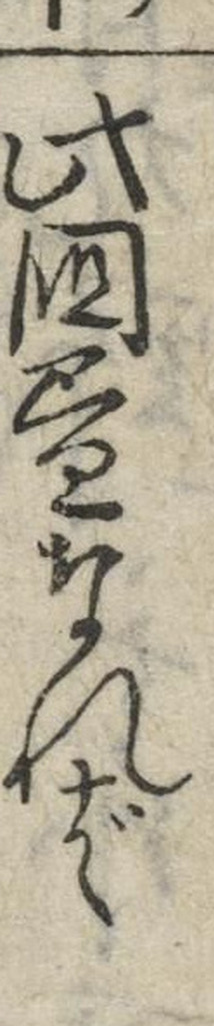此国昼なれば
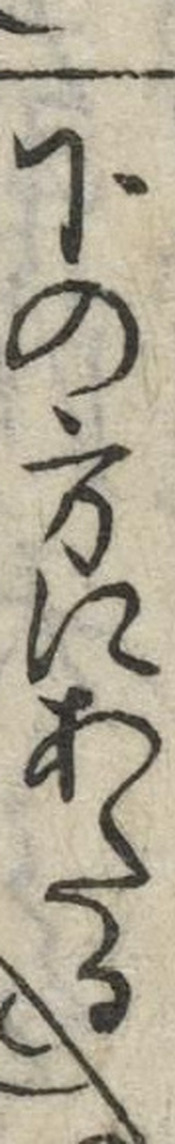下の方にあたる
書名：訓蒙天地辨　天
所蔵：東京大学地震研究所図書室 Earthquake Research Institute Library, The University of Tokyo, JAPAN
